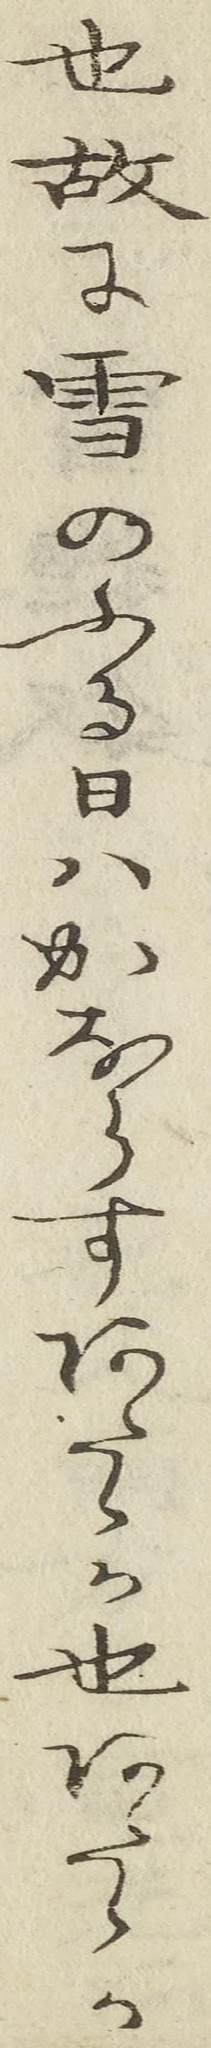也故に雪のふる日はかならすあたゝか也あたゝか
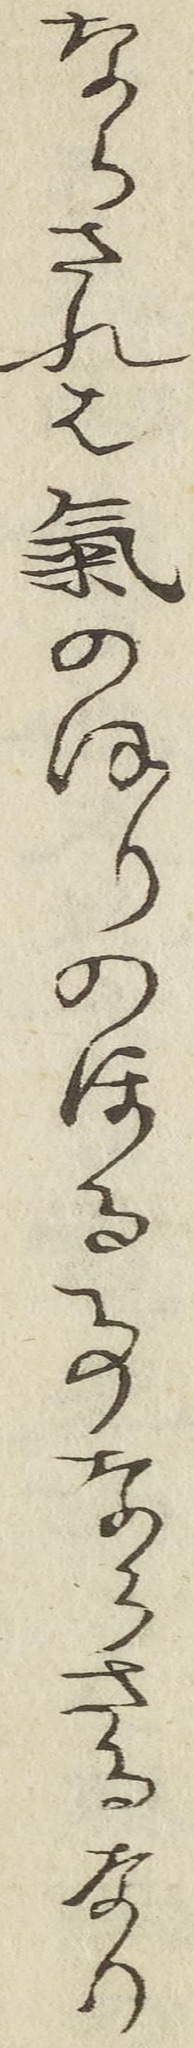ならされは気のほりのほる事ならさるなり
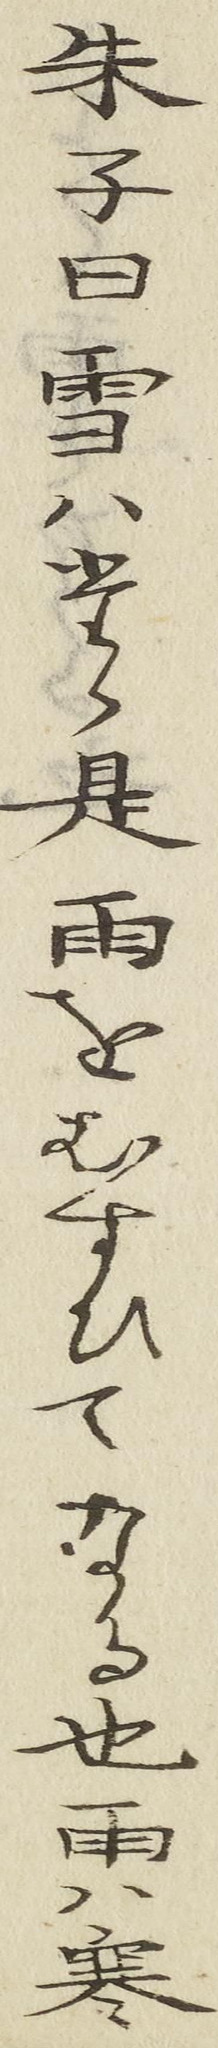朱子曰雪はたゝ是雨をむすひてなる也雨は寒
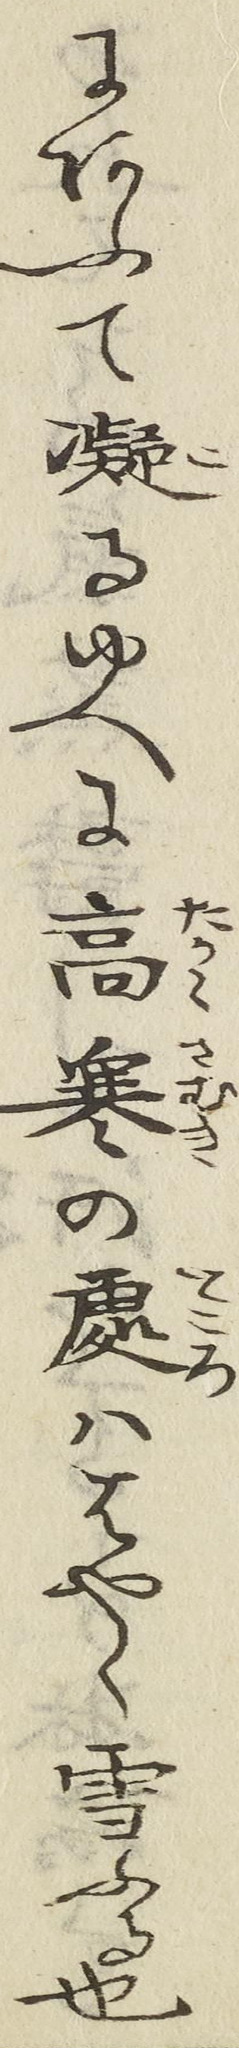にあふて凝るゆへに高寒の処ははやく雪ふる也
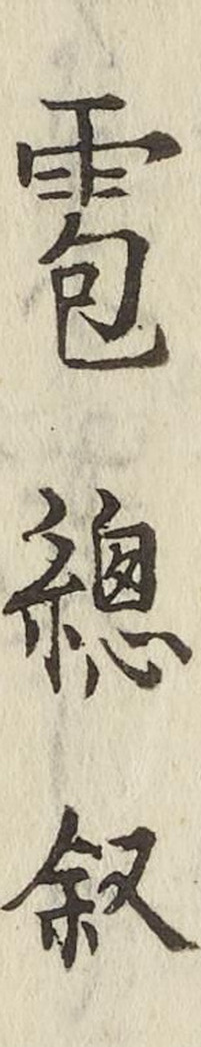雹総叙
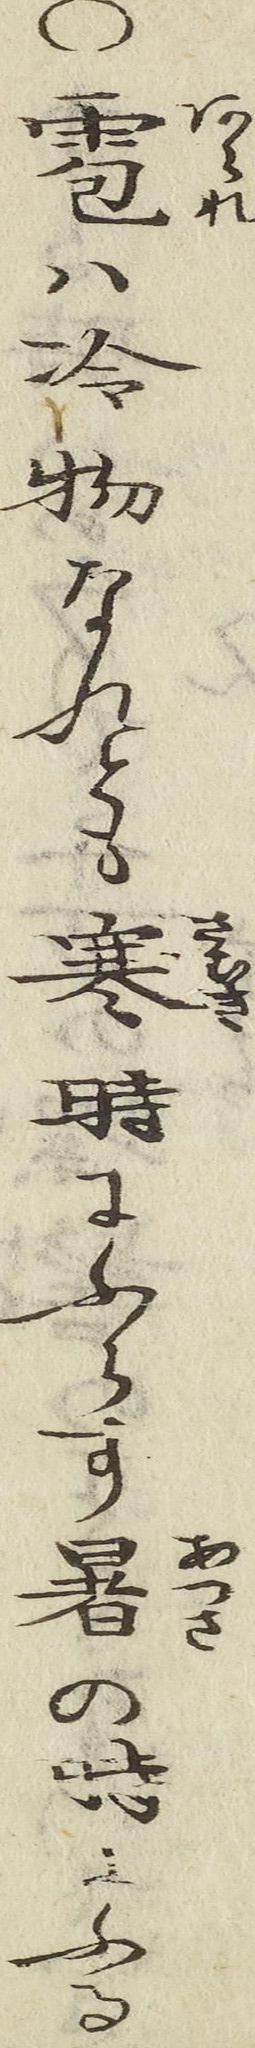○雹は冷物なれとも寒時にふらす暑の時にふる
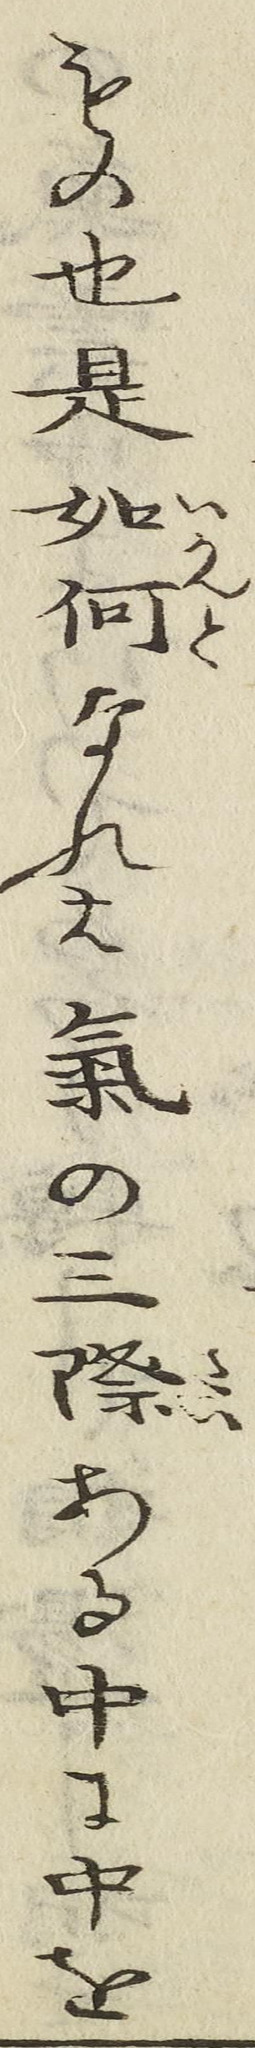もの也是如何なれは気の三際ある中に中を
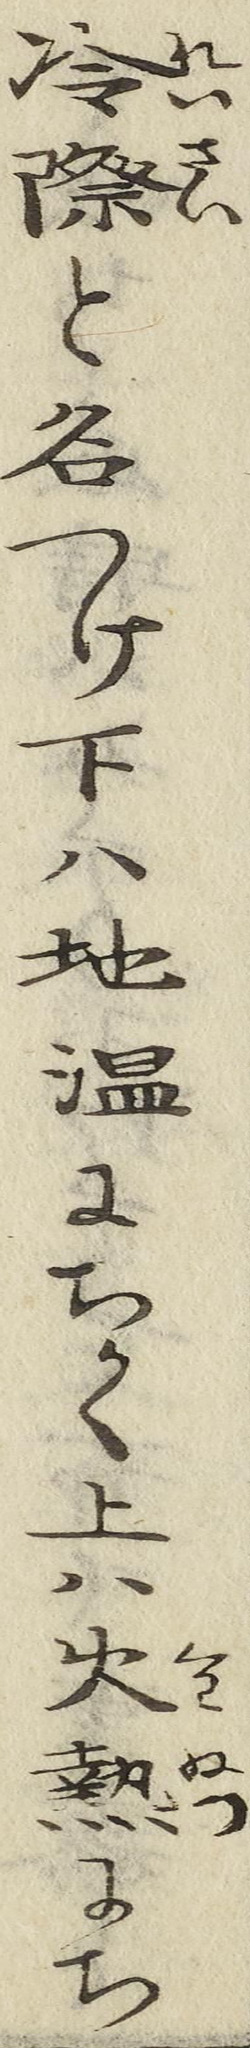冷際と名つけ下は地温にちかく上は火熱にち
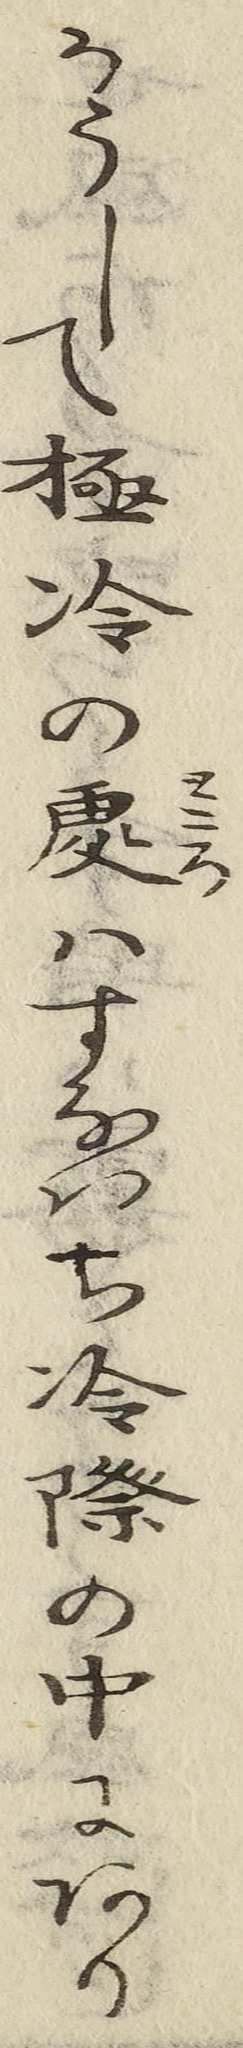かうして極冷の処はすなはち冷際の中にあり
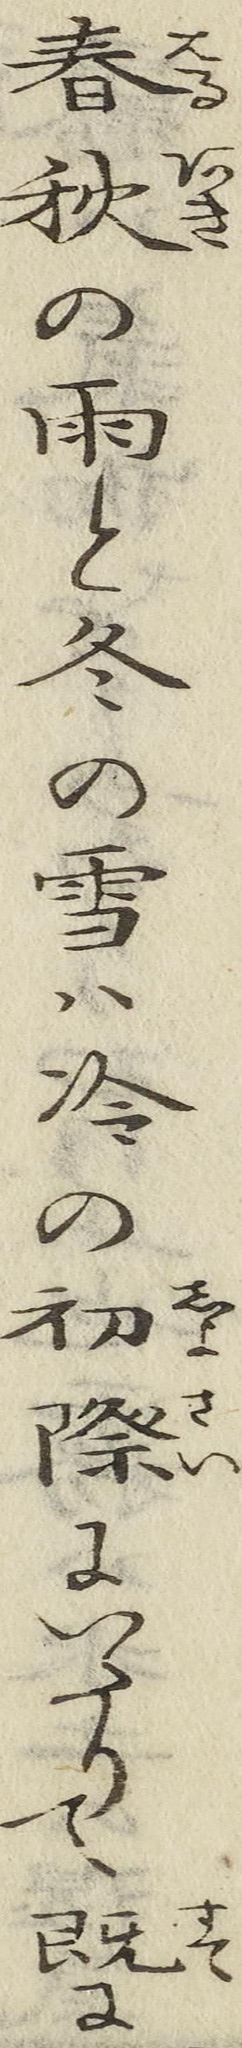春秋の雨と冬の雪は冷の初際にいたりて既に
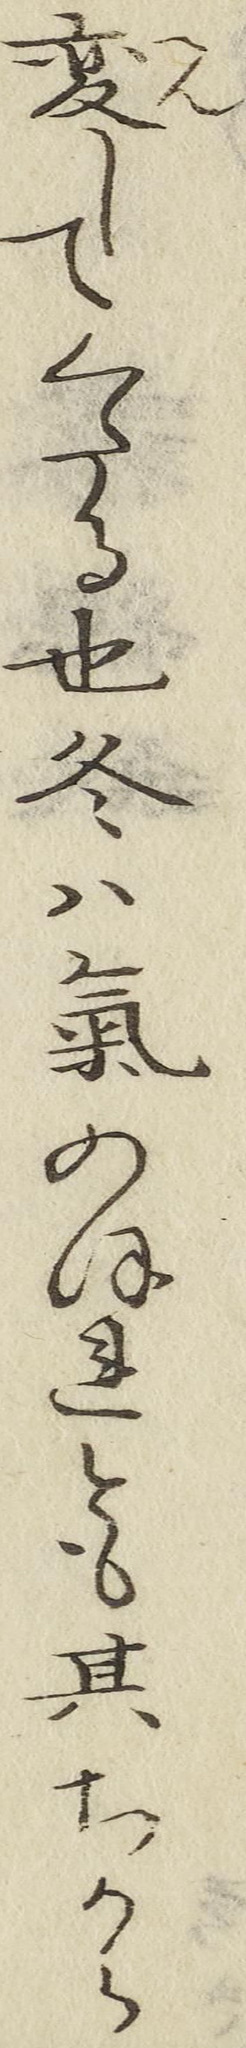変してくたる也冬は気のほれとも其ちから
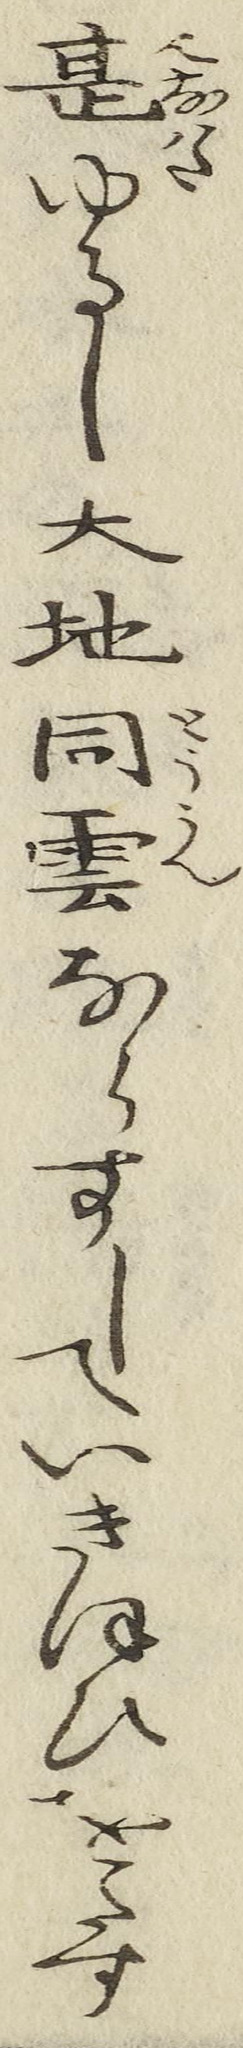甚ゆるし大地同雲ならすしていきほいをたす
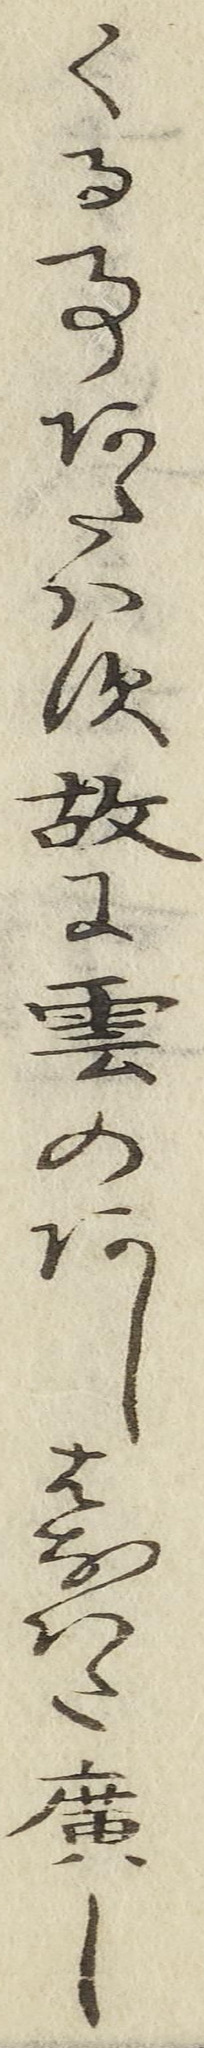くる事あたはす故に雲のあしはなはた広し
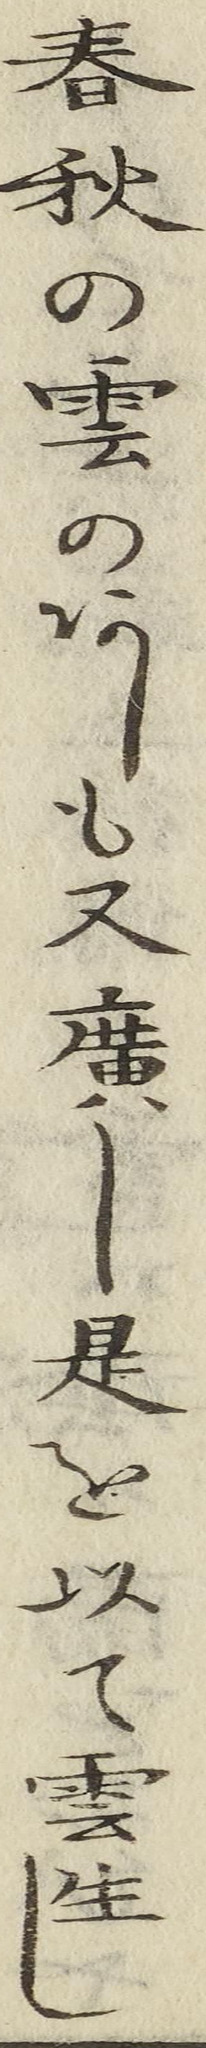春秋の雲のあしも又広し是を以て雲生し
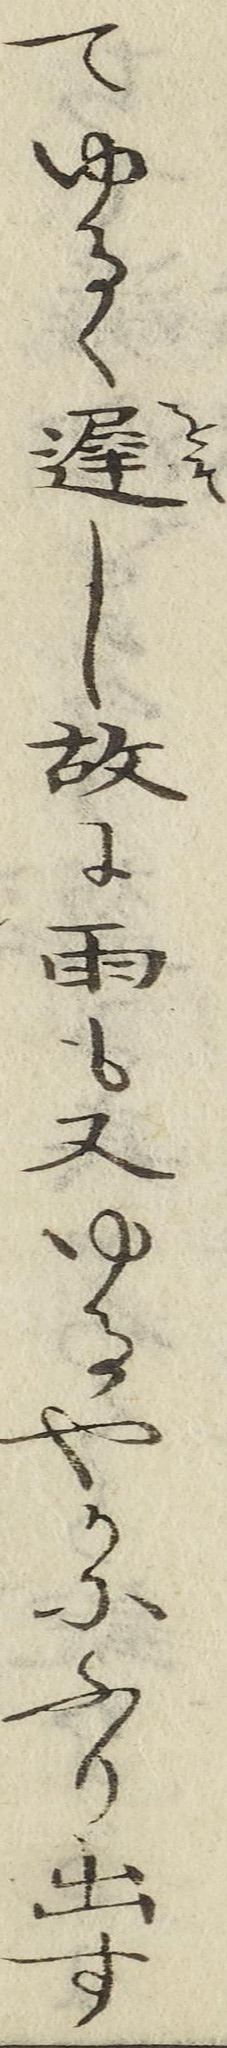てゆるく遅し故に雨も又ゆるやかにふり出す
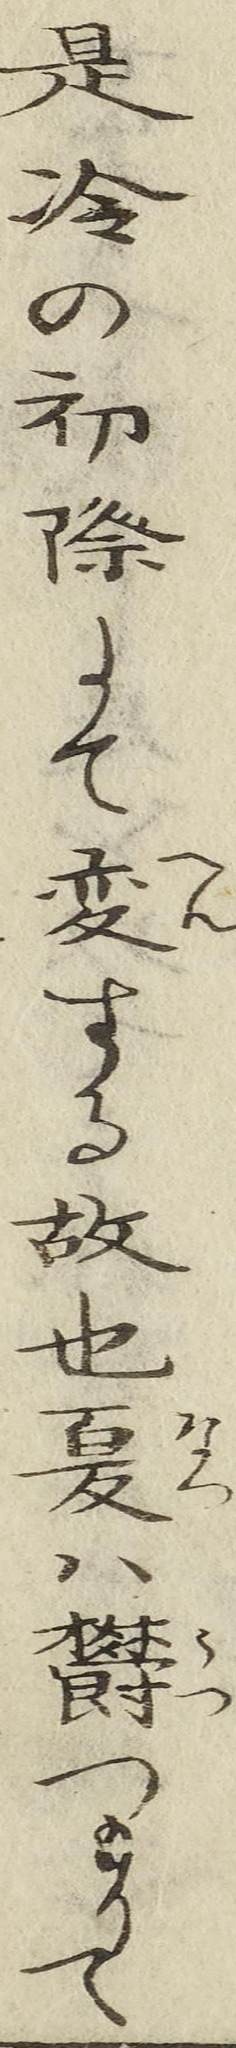是冷の初際にて変する故也夏は欝つもりて
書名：天時占候　二
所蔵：東京大学地震研究所図書室 Earthquake Research Institute Library, The University of Tokyo, JAPAN
